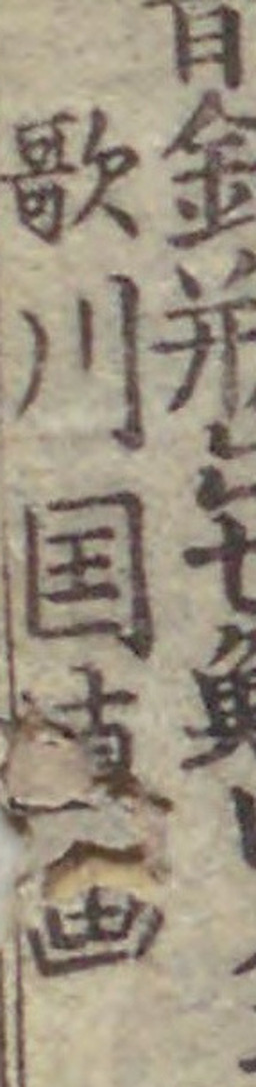歌川国直画

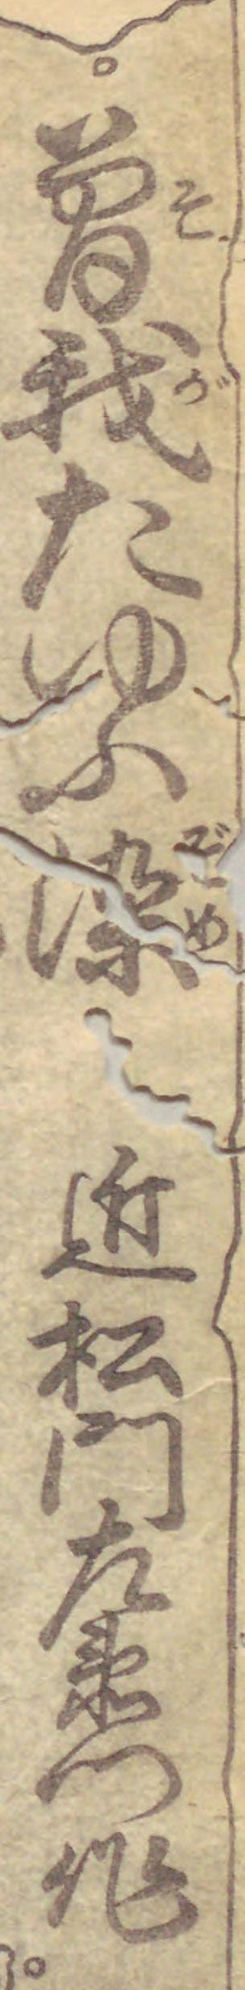曽我たゆふ染近松門左衛門作
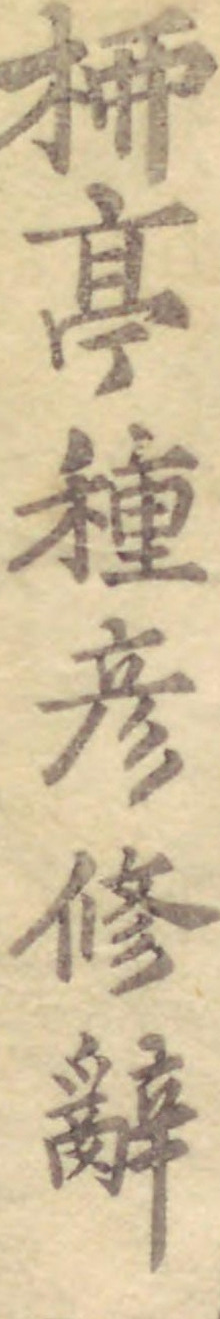柳亭種彦修辞
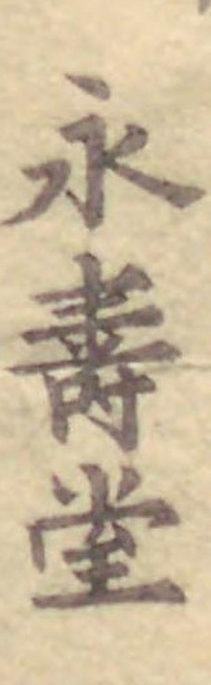栄寿堂
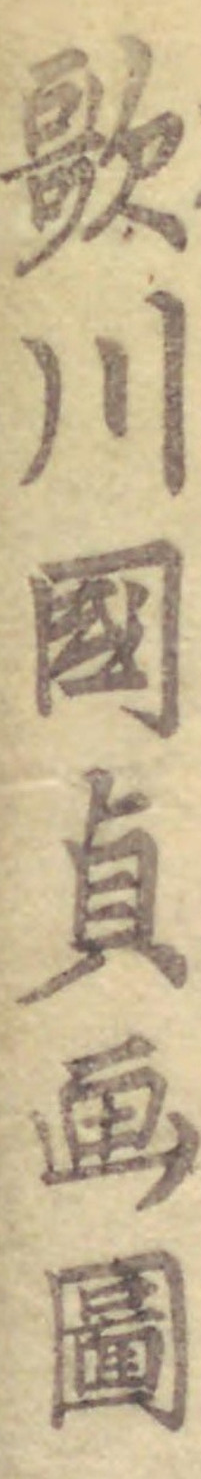歌川国貞画図
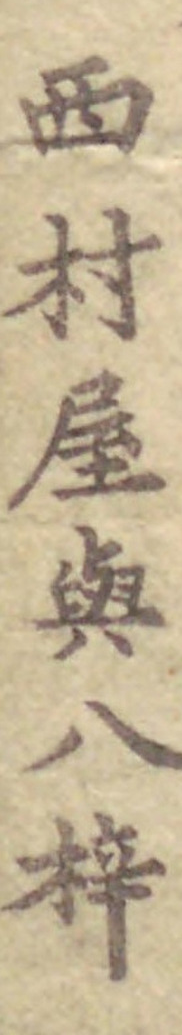西村屋与八梓
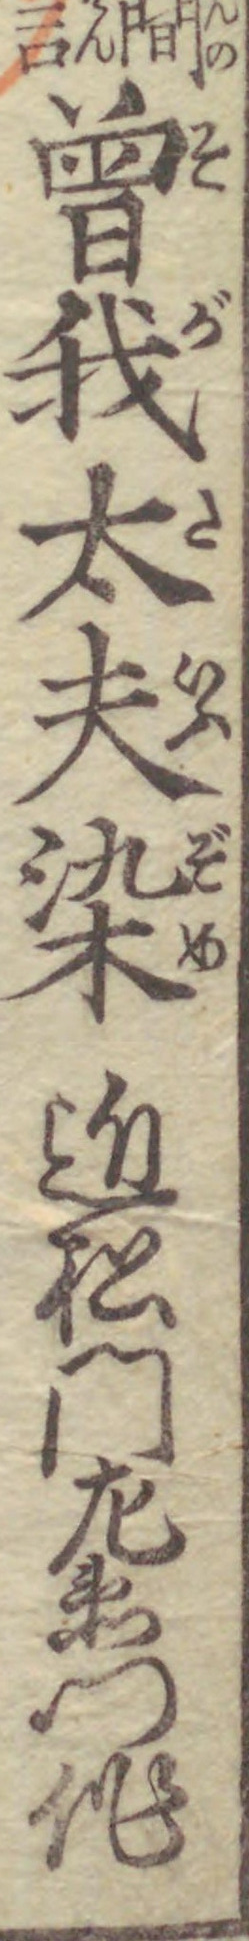曽我たゆふ染近松門左衛門作
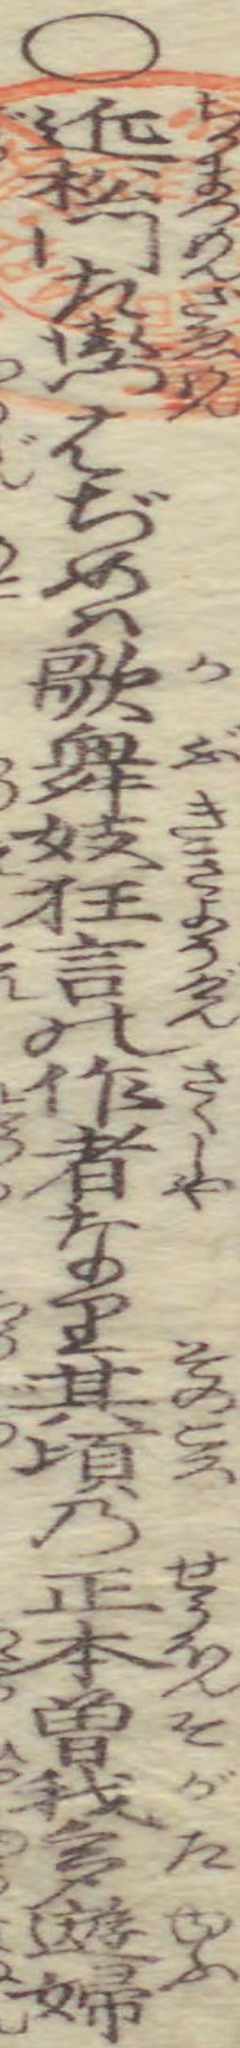○近松門左衛門はぢめは歌舞伎狂言なり其頃の正本曽我多遊婦
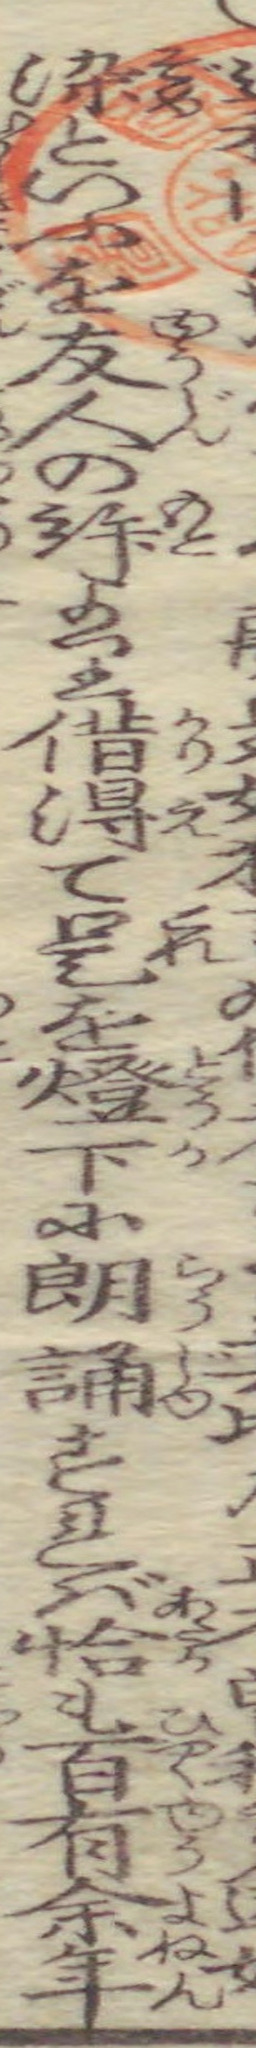染といふを友人の許より借得て是を灯火に朗誦すれば恰も百有余年
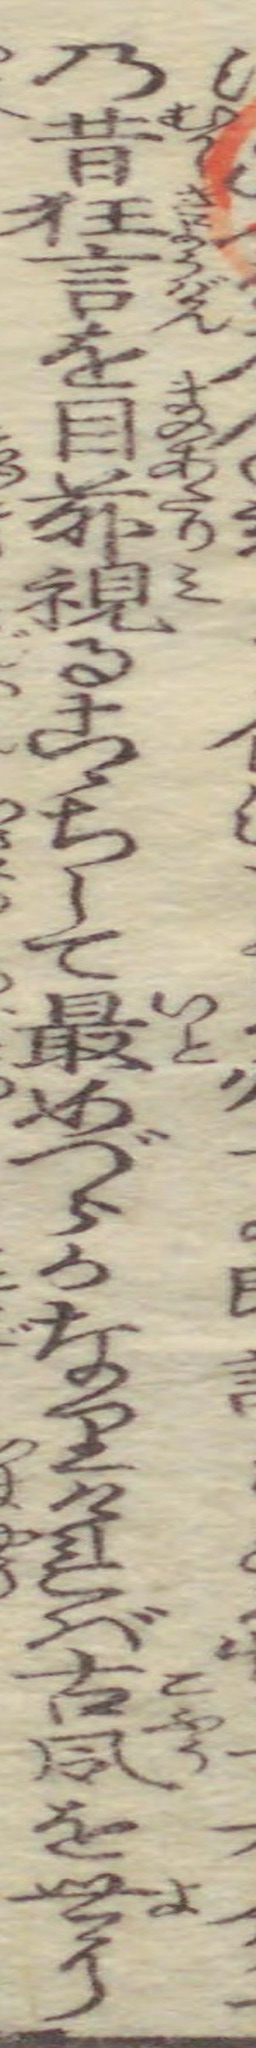の昔狂言を目前視るこゝちして最めづらかなりければ古風を世に
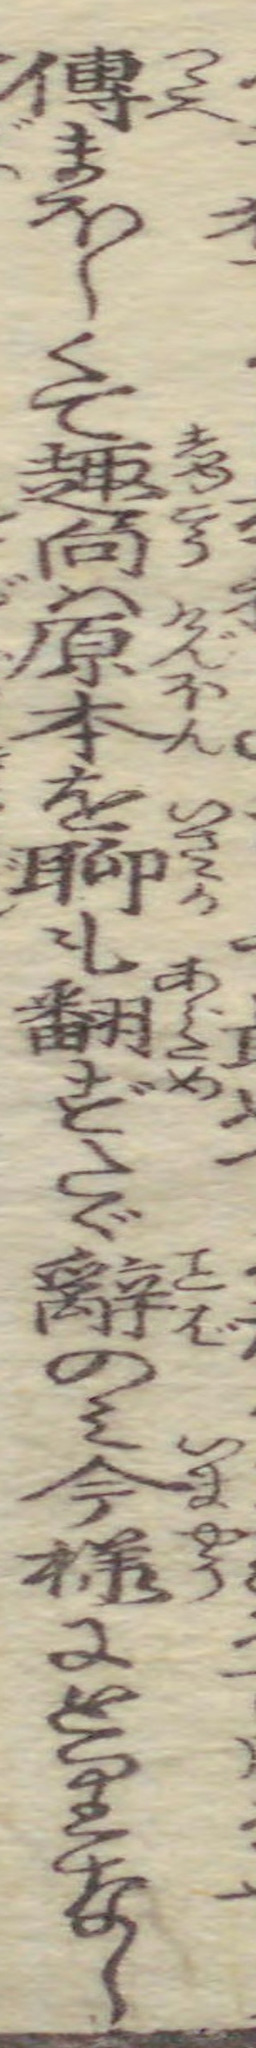傳まほしくて趣向は原本を聊も翻ずたゞ辞のみ今様にとりなし
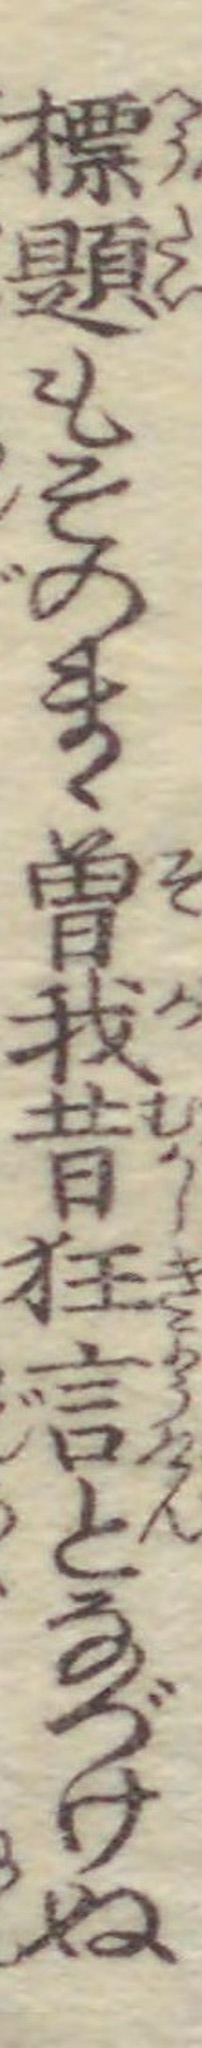標題もそのまゝ曽我昔狂言となづけぬ
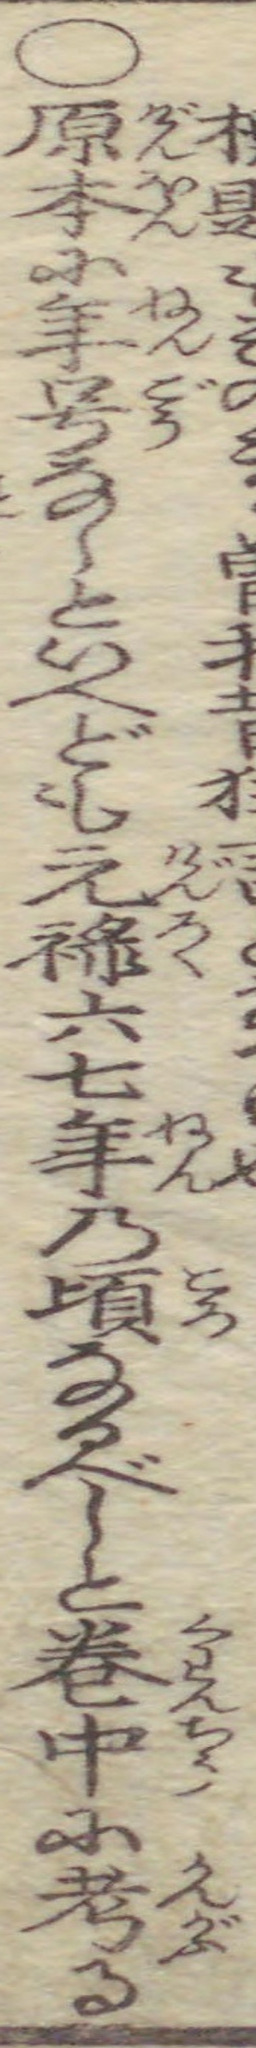○原本に年号なしといへども元禄六七年の頃なるべしと巻中に考る
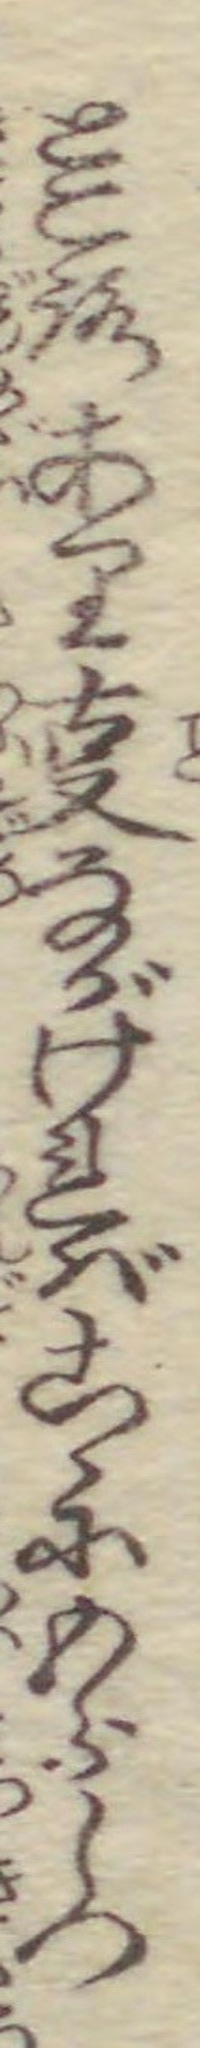ところあり事ながければこゝにもらしつ
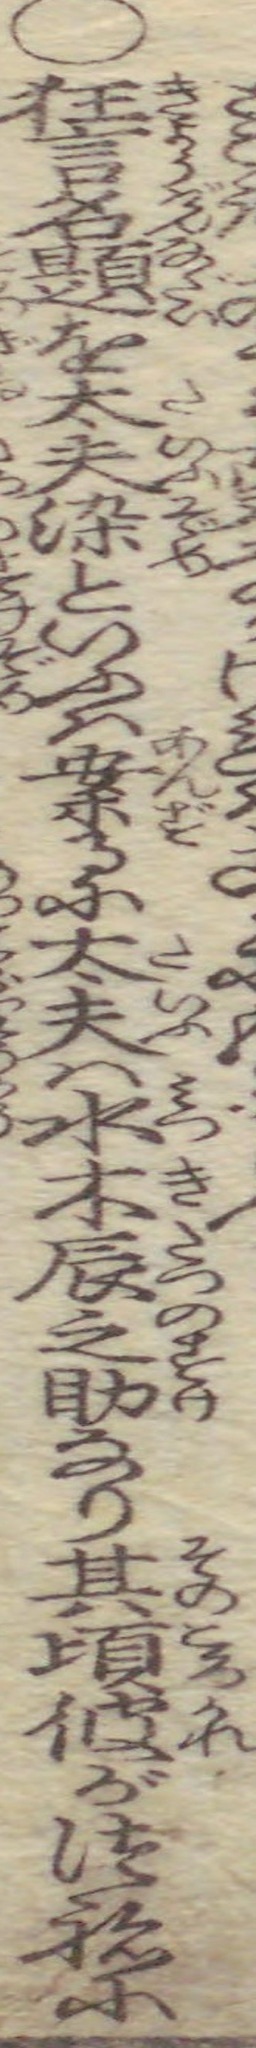○狂言名題を太夫染といふは案るに太夫は水木辰之助なり其頃彼がつねに
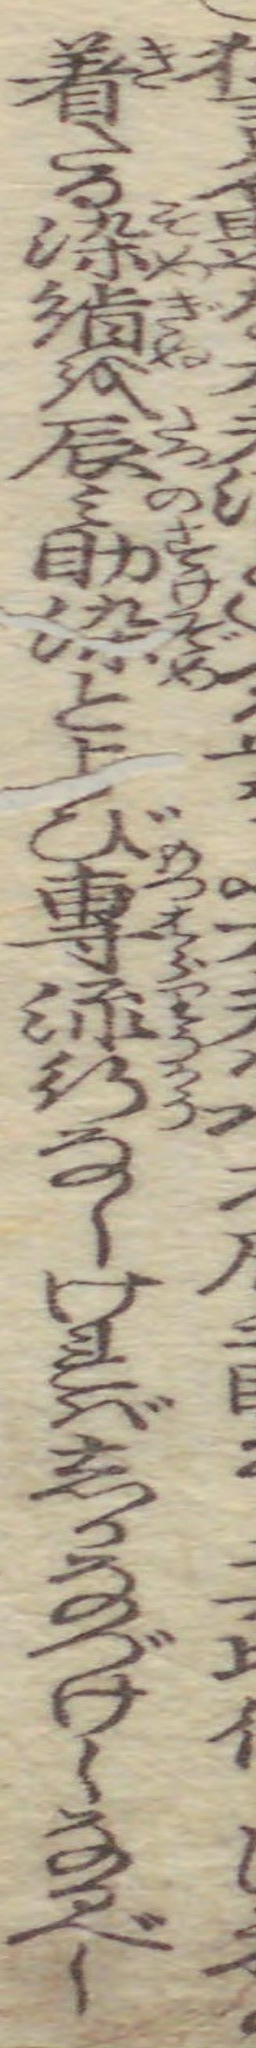着たる染絹を辰之助染とよび専流行なしければしかなづけしなるべし
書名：大時代唐土化物 3巻. 曽我太夫染
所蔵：国立国会図書館 National Diet Library, JAPAN
